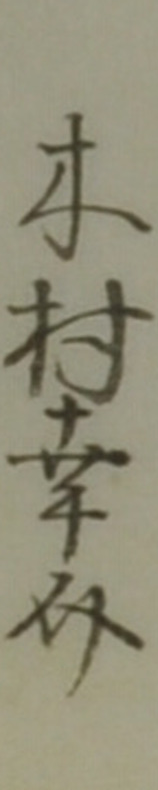木村幸介
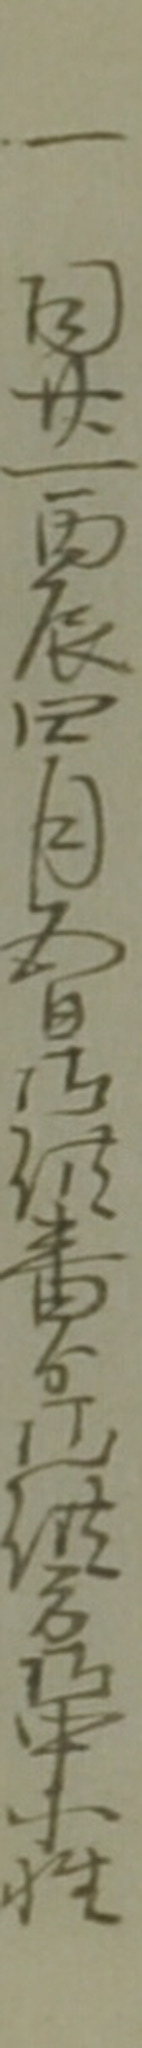一同廿一丙辰四月五日御供番ゟ御供方御中小性
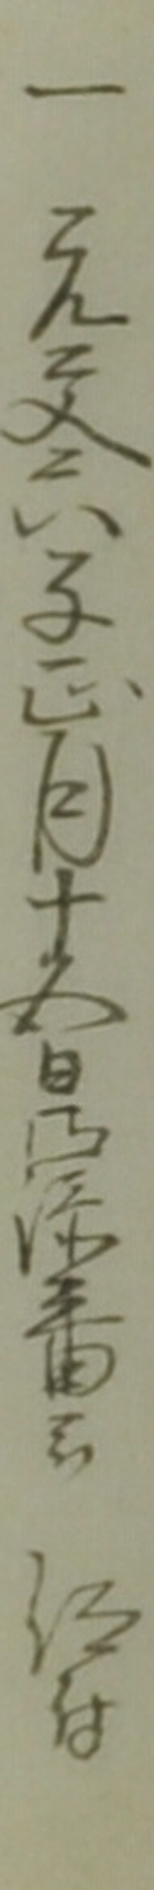一元文六子正月十五日御添番被仰付
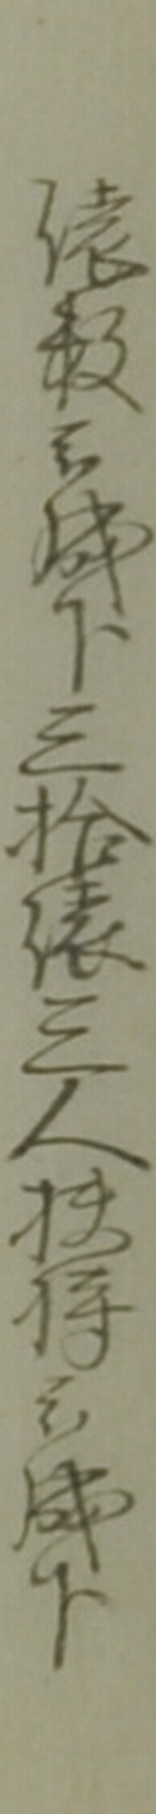俵数被成下三拾俵三人扶持被成下
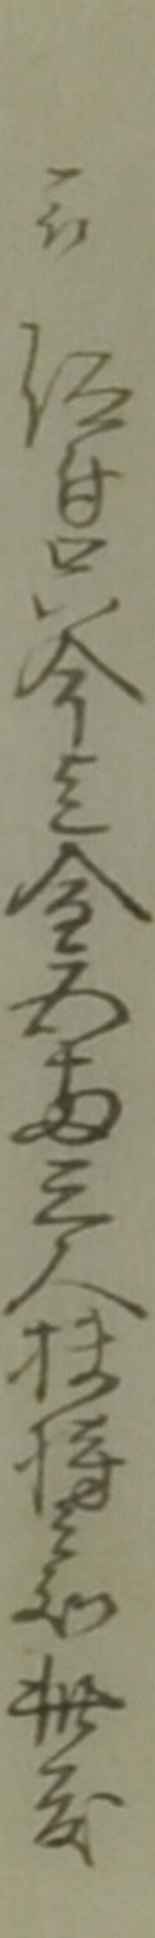被仰付只今迄金五両三人扶持之処此度
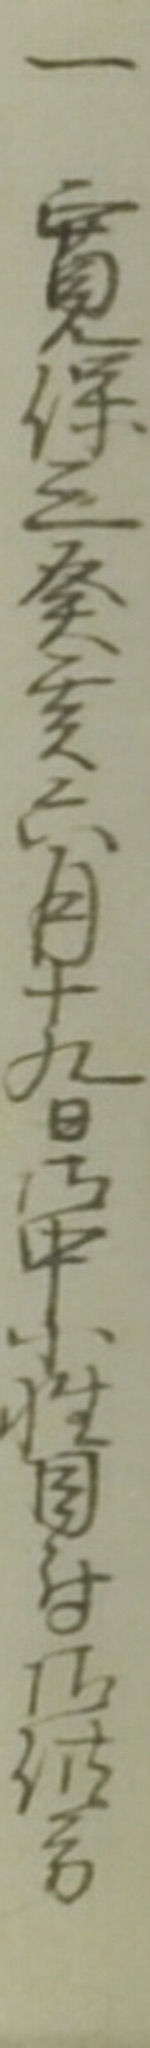一寛保三癸亥六月十九日御中小性目付御供方

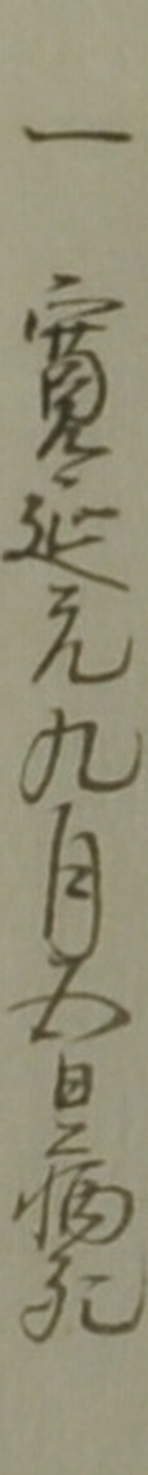一寛延元九月五日病死
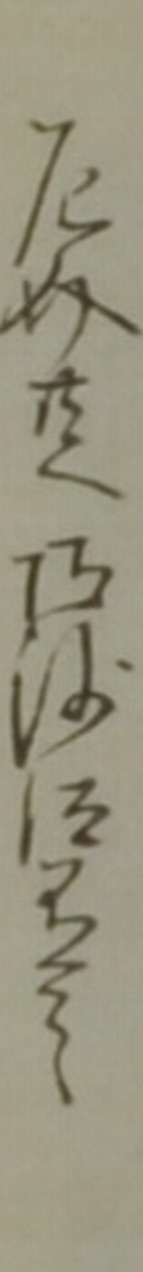厄介共へ御沙汰有之
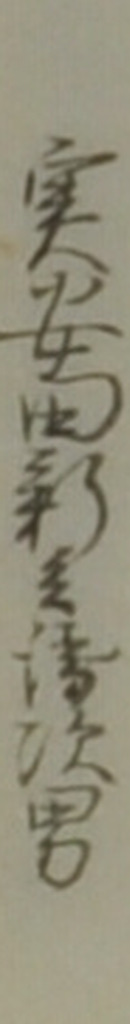実安田新兵衛次男
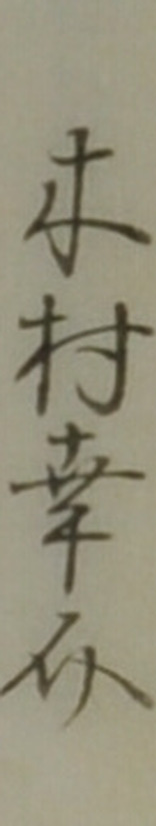木村幸介

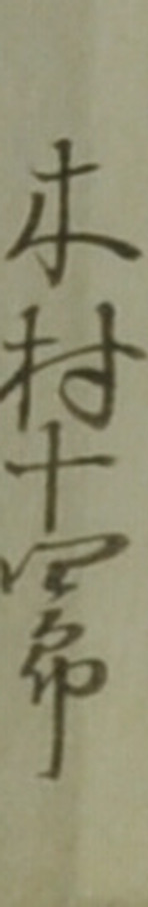木村十四郎
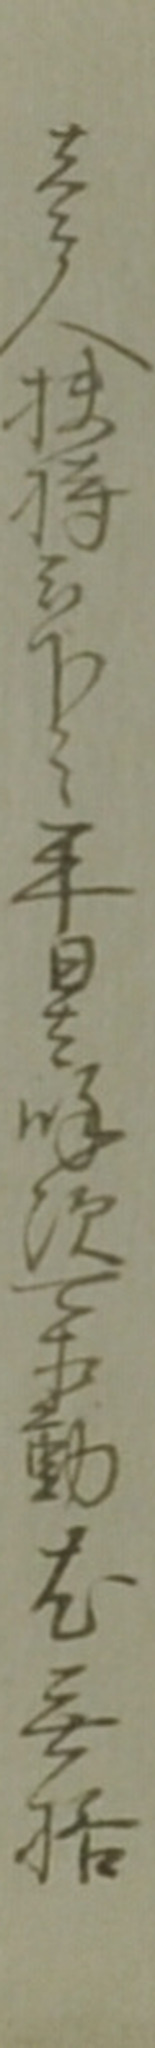壱人扶持被下之平日者呼次可相勤尤無格
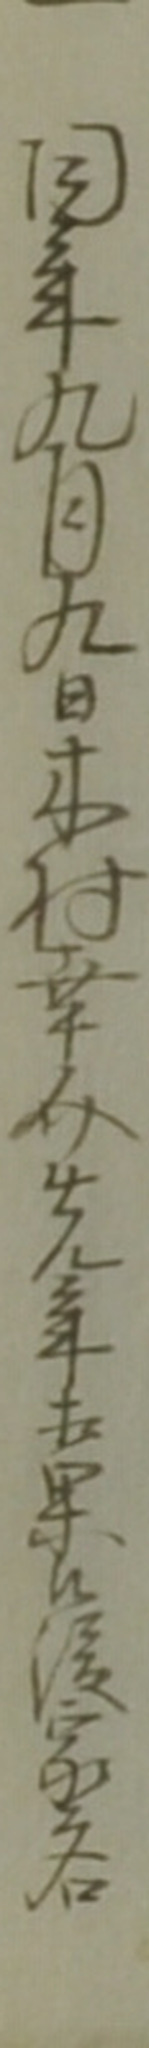一同年九月九日木村幸介先年相果候後家名
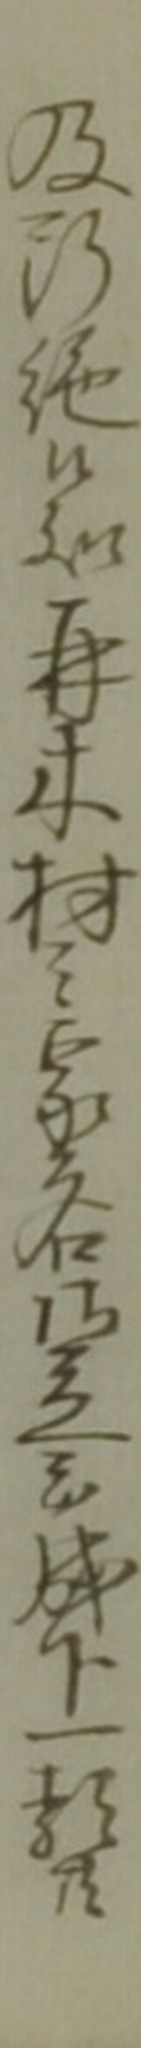及断絶候処再木村之家名御立被成下一類共
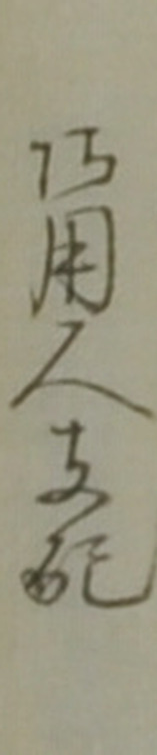御用人支配
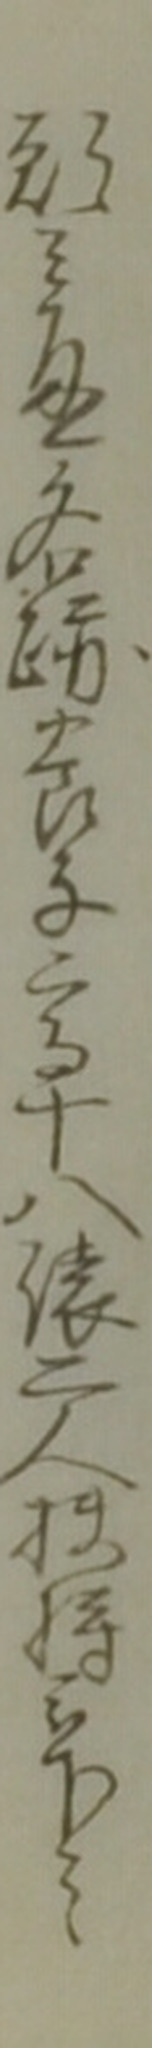願之通名跡養子高十八俵二人扶持被下之
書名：無足諸士勤仕録（九）
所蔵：伊那市立高遠町図書館・合同会社AMANE
